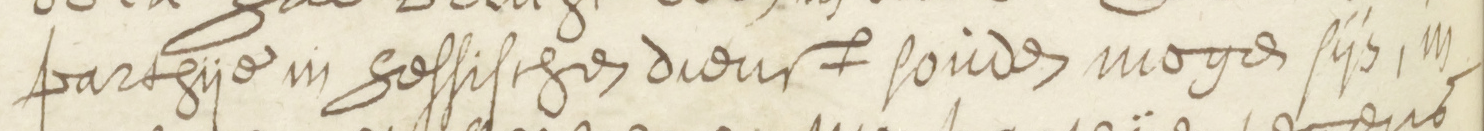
parthije in hessischen dienst souden mogen sijn, in
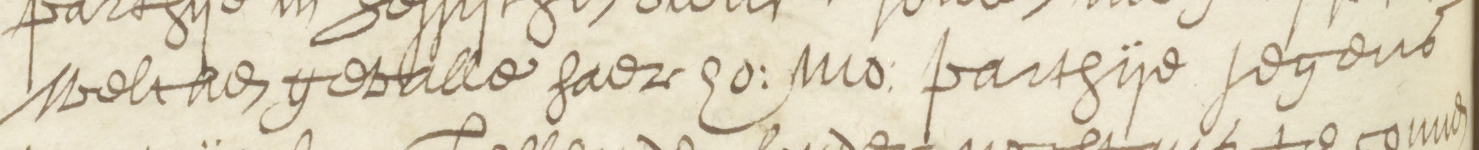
welcken gevalle haer ho:Mo: parthije jegens
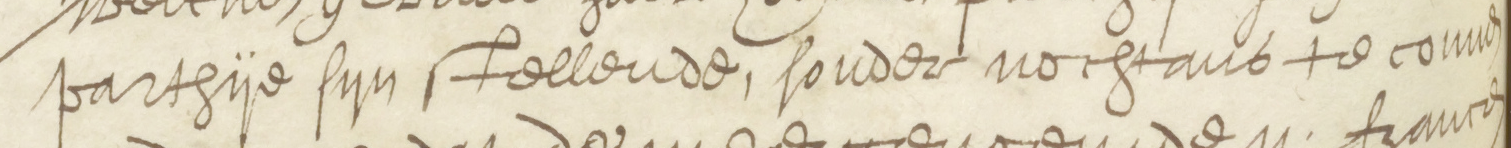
parthije sijn stellende, sonder nochtans te connen
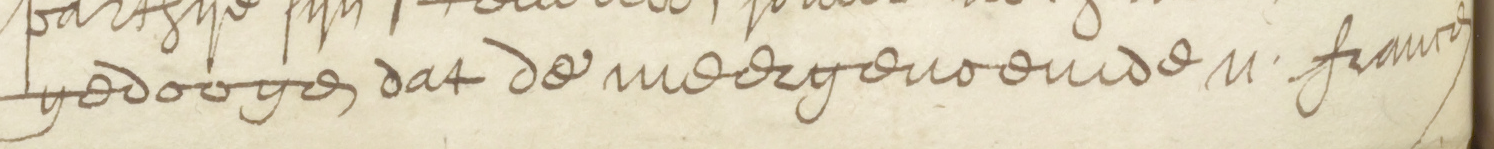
gedoogen dat de meergenoemde n. francen
